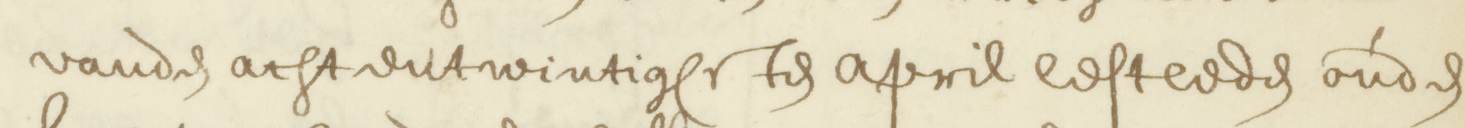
vanden achtentwintighsten april lestleden ouden
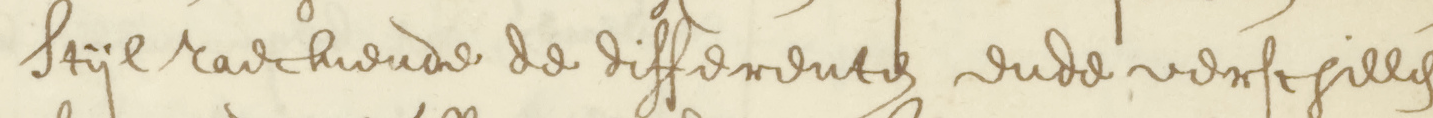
Stijl raeckende de differenten ende verschillen
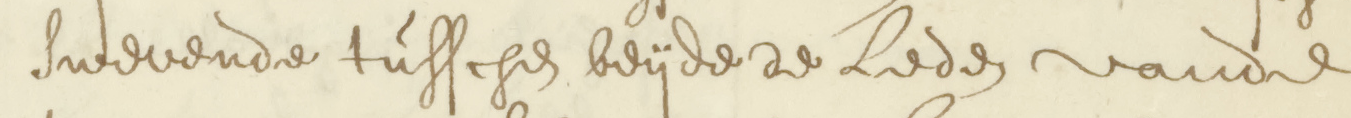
Swevende tusschen beijde de Leden vande
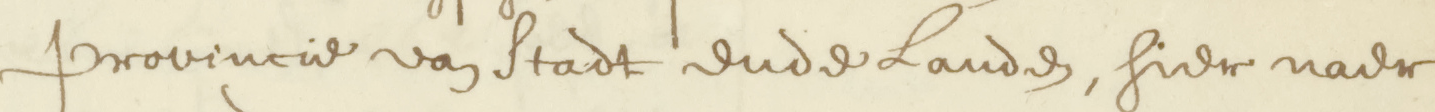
Provincie van Stadt ende Landen, hier naer
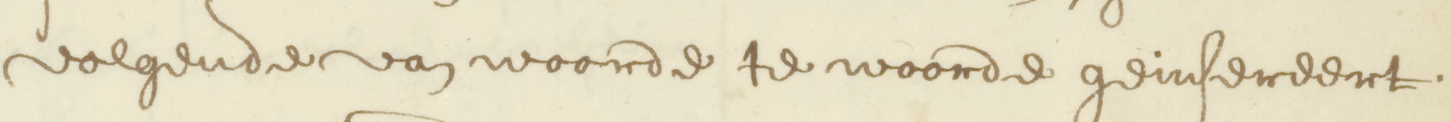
volgende van woorde te woorde geinsereert.
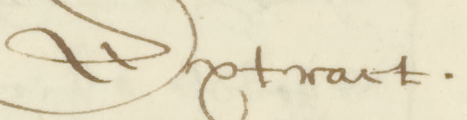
Extract.
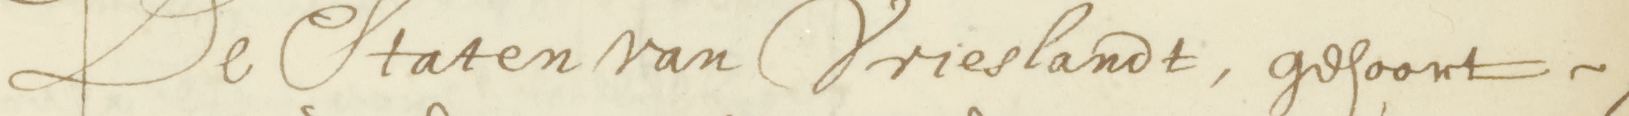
De Staten van Vrieslandt, gehoort
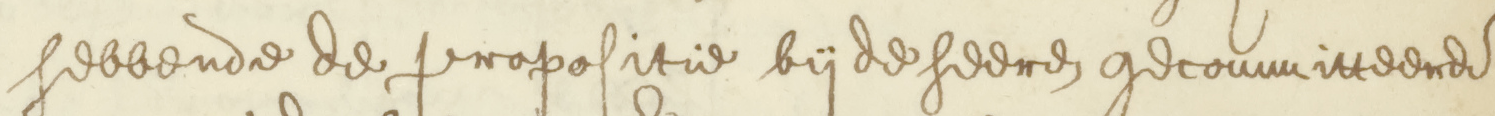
hebbende de propositie bij de heeren gecommitteerde
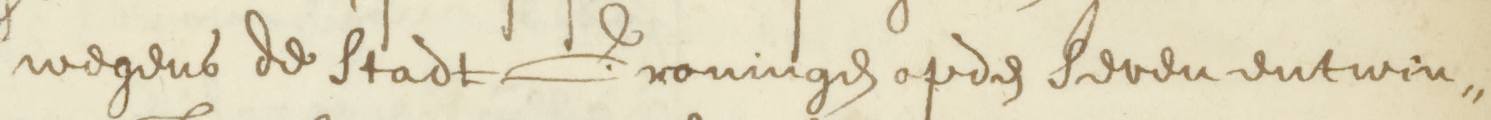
wegens de stadt Groningen opden sevenentwin„
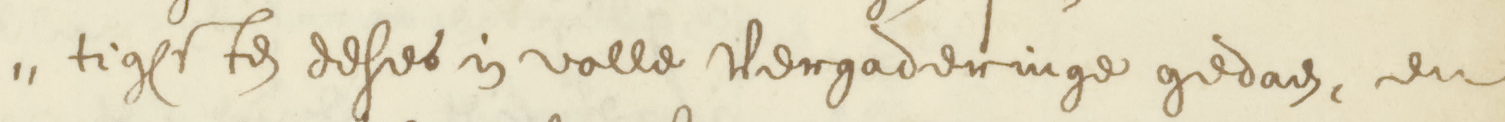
„tighsten deses in volle Vergaderinge gedaen, en
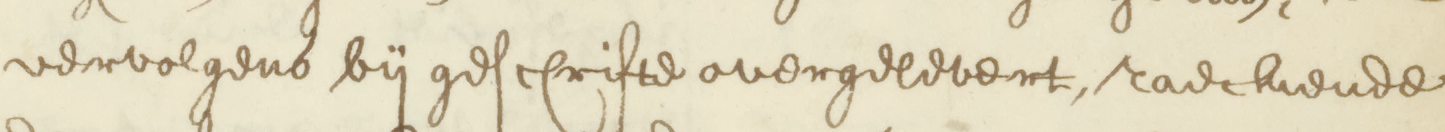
vervolgens bij geschrifte overgelevert, raeckende
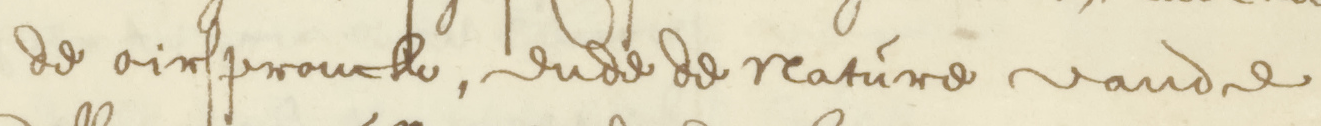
de oirspronck, ende de Nature vande
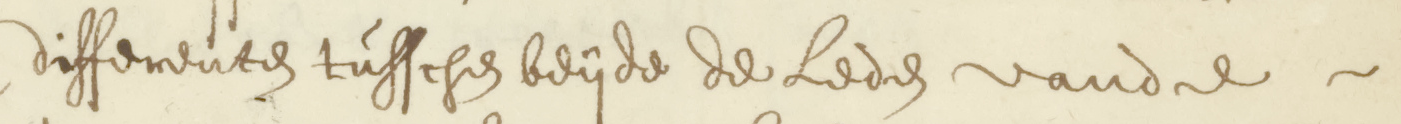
differenten tusschen beijde de Leden vande
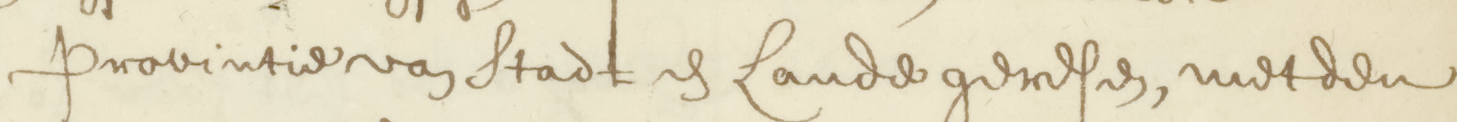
Provintie van Stadt en Lande geresen, met den
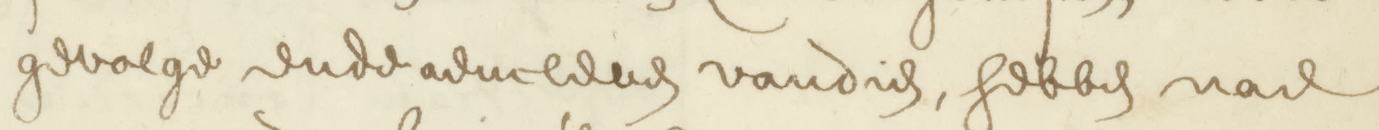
gevolge ende aencleven vandien, hebben nae
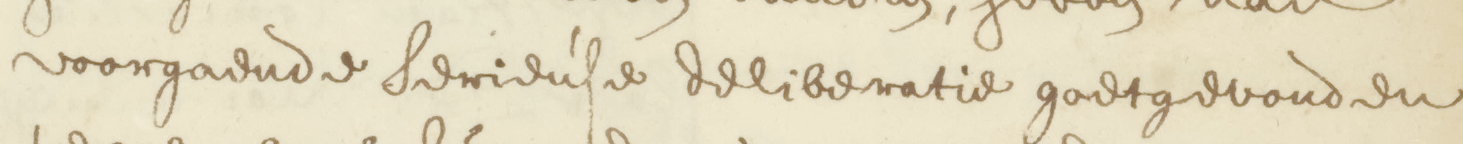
voorgaende Serieuse deliberatie goetgevonden
